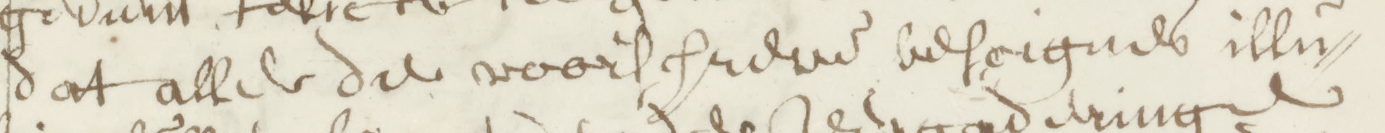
dat alle de voorschreve besoignes illu„
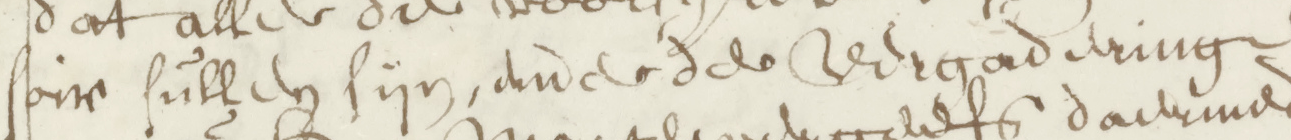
soir sullen sijn, ende de vergaderinge
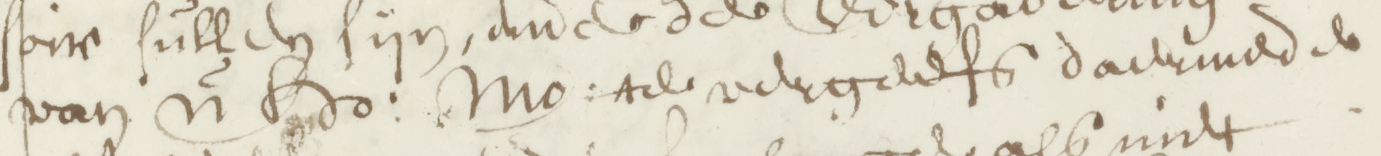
van U. Ho:Mo: te vergeefs daermede
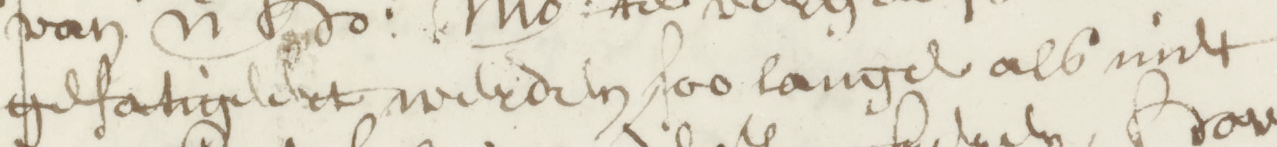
gefatigeert werden, soo lange als met
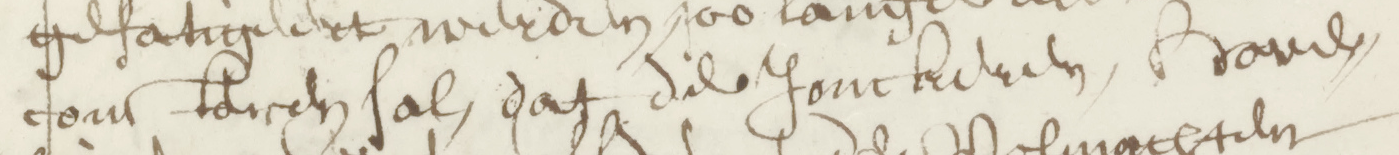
consteren sal, dat de jonckeren, hove„
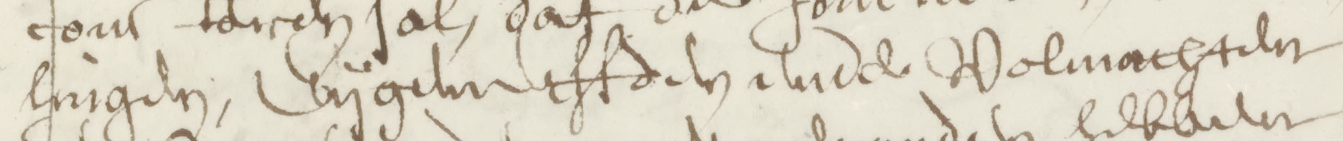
lingen, eigenerffden ende volmachten
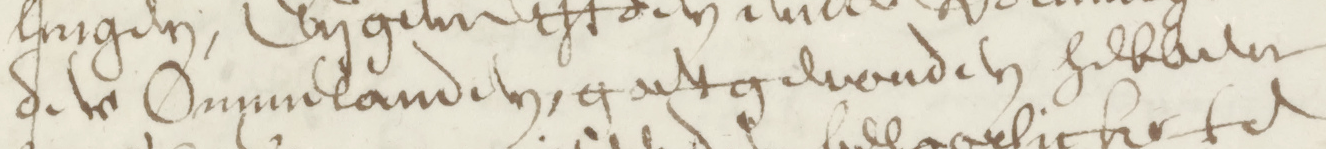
der Ommelanden, goetgevonden hebben
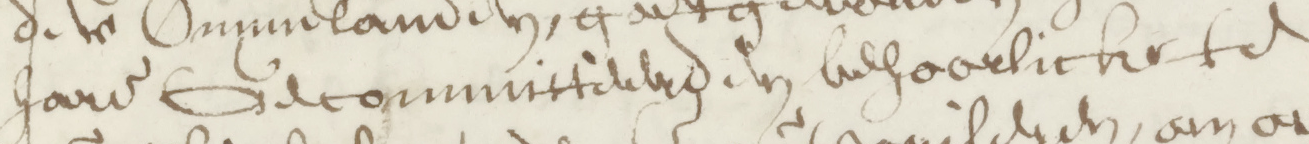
hare Gecommitteerden behoorlick te
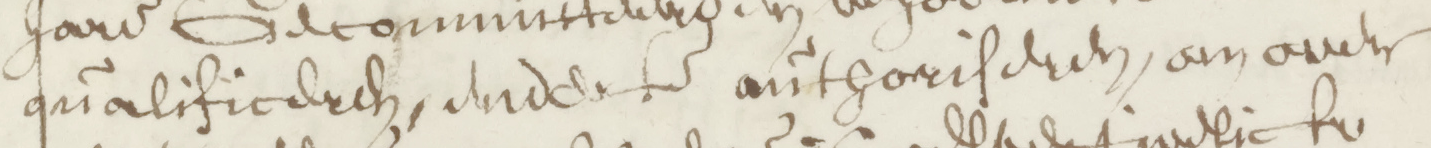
qualificeren, ende te authoriseren, om over
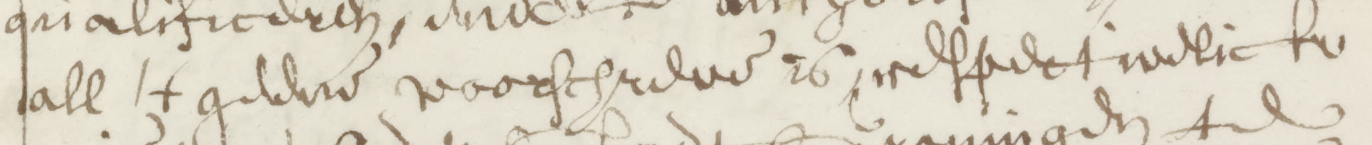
all 't geene voorschreve is respectivelick
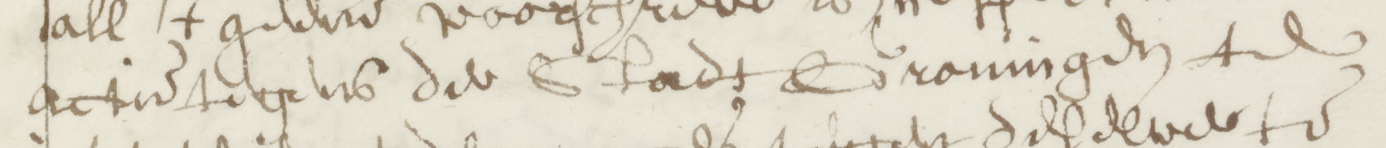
actie tegens de Stadt Groningen te
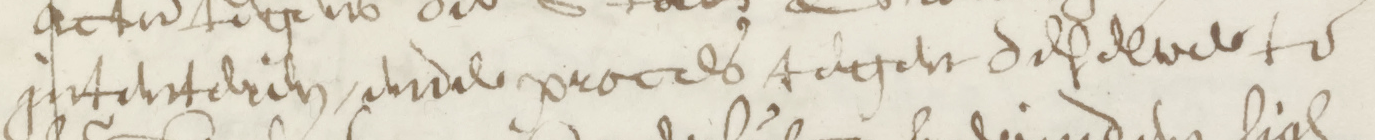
intenteren, ende proces tegen deselve te
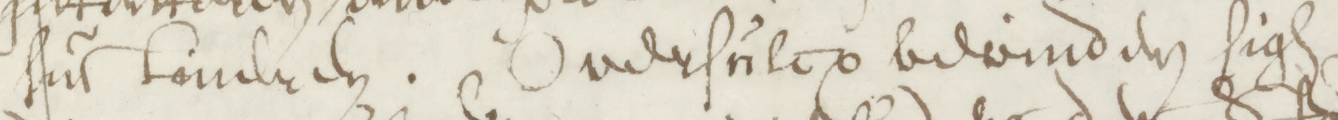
sustineren. Oversulcx bevinden sich
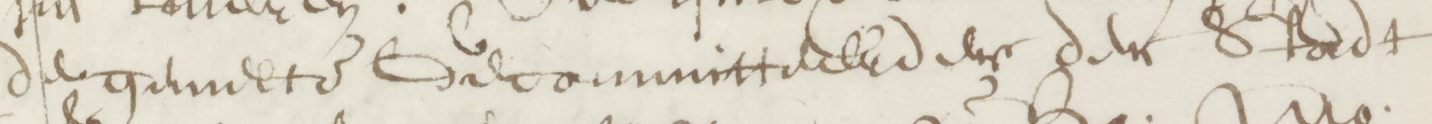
de gemelte gecommitteerden der Stadt
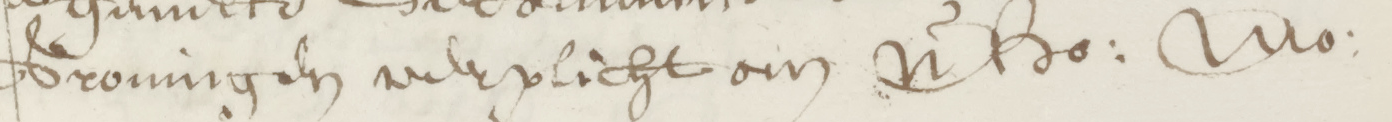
Groningen verplicht om U. Ho:Mo:
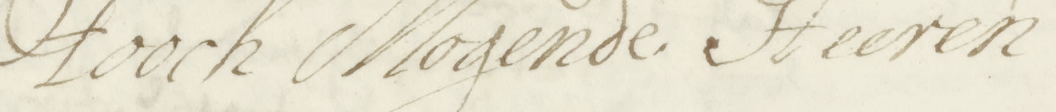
Hooch Mogende Heeren
